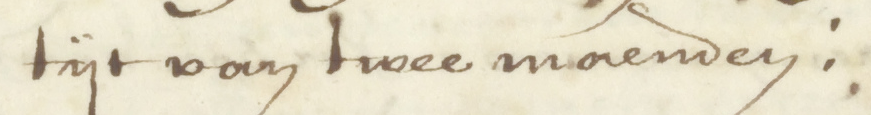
tijt van twee maenden:
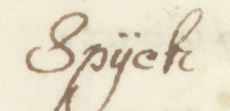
Spijck
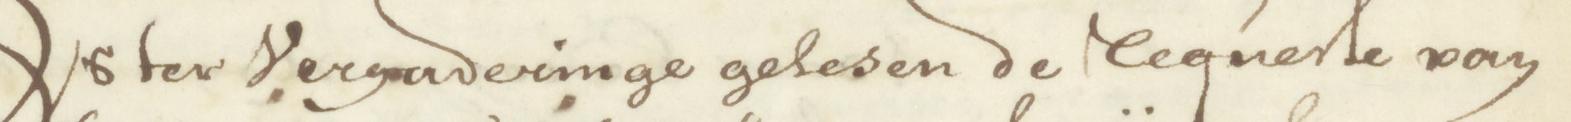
Is ter Vergaderinge gelesen de Requeste van
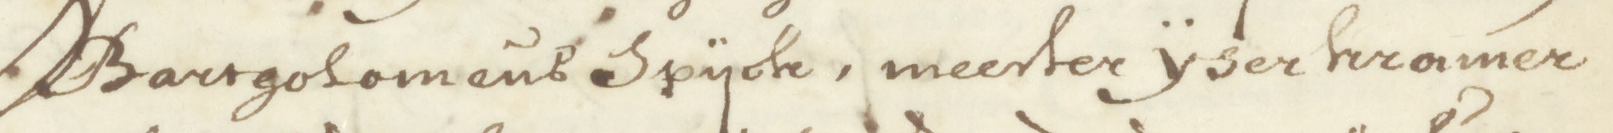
Bartholomeus Spijck, meester ijserkramer
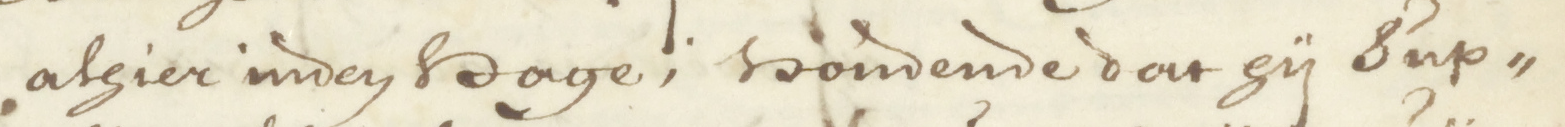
alhier inden Hage; houdende dat hij Sup„
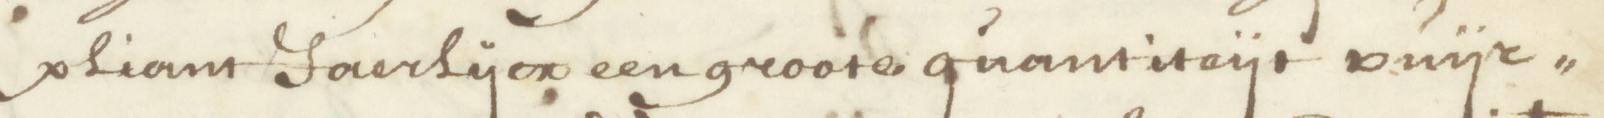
pliant Jaerlijcx een groote quantiteijt vuijr„
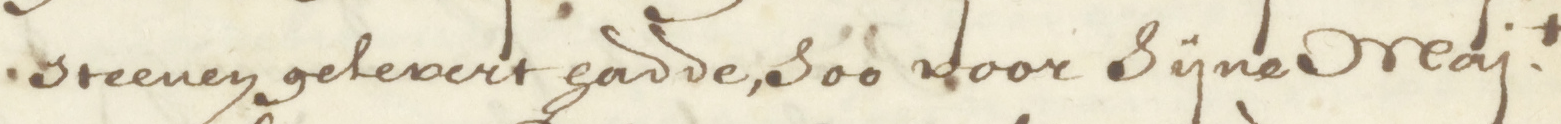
steenen gelevert hadde, soo voor Sijne Majt.
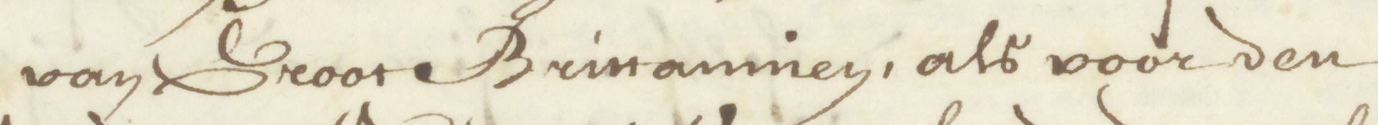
van Groot Brittannien, als voor den
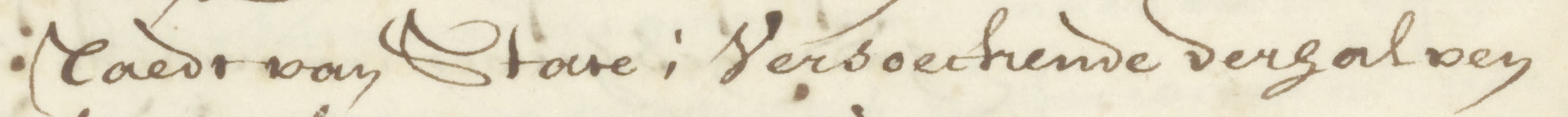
Raedt van State; Versoeckende derhalven
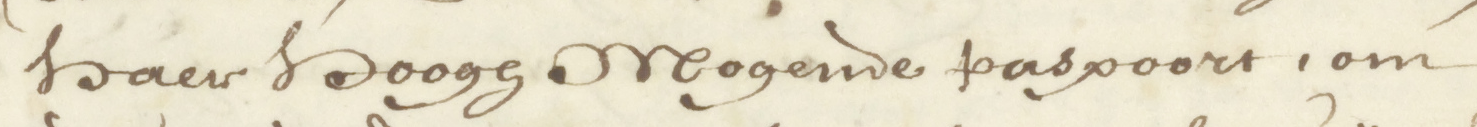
Haer Hoogh Mogende paspoort, om
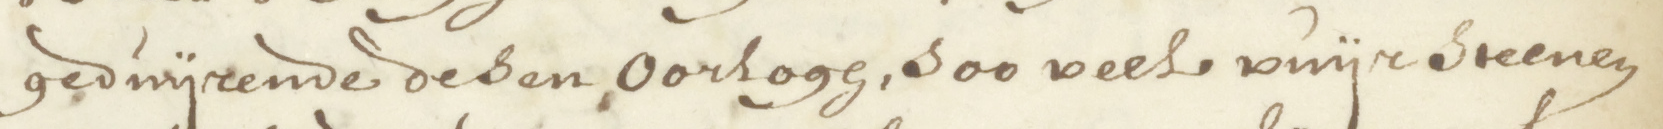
geduijrende desen Oorlogh, soo veel vuijrsteenen
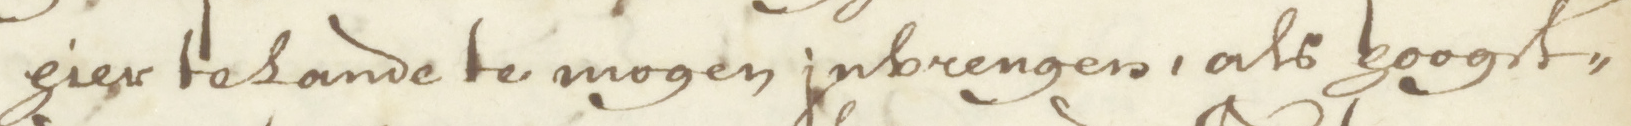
hier te lande te mogen inbrengen, als hoogst„
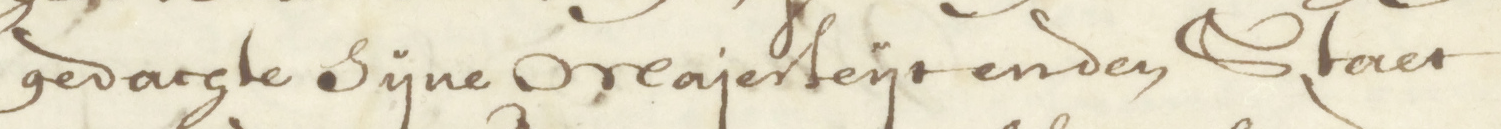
gedachte Sijne Majesteijt en den Staet
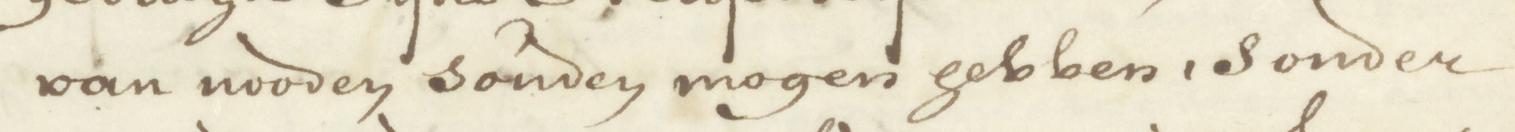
van nooden souden mogen hebben, sonder
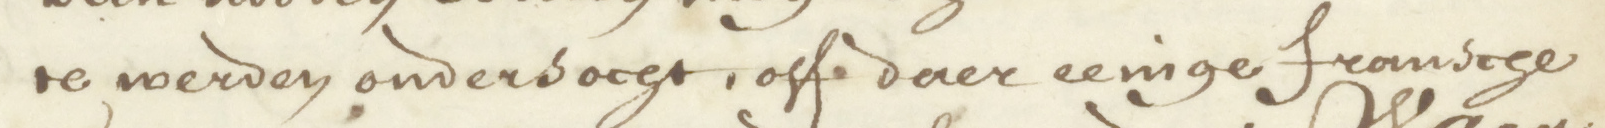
te werden ondersocht, off daer eenige fransche
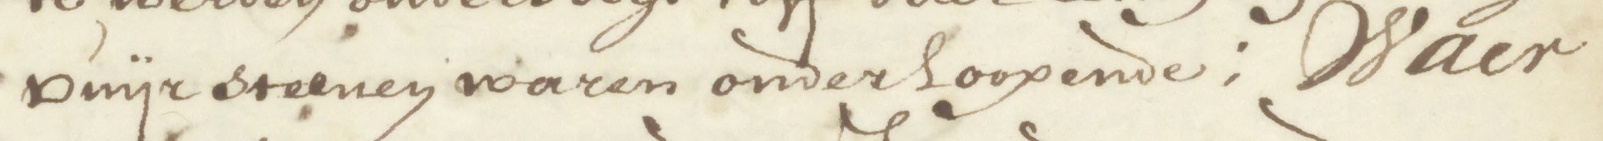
vuijrsteenen waren onderloopende; Waer
